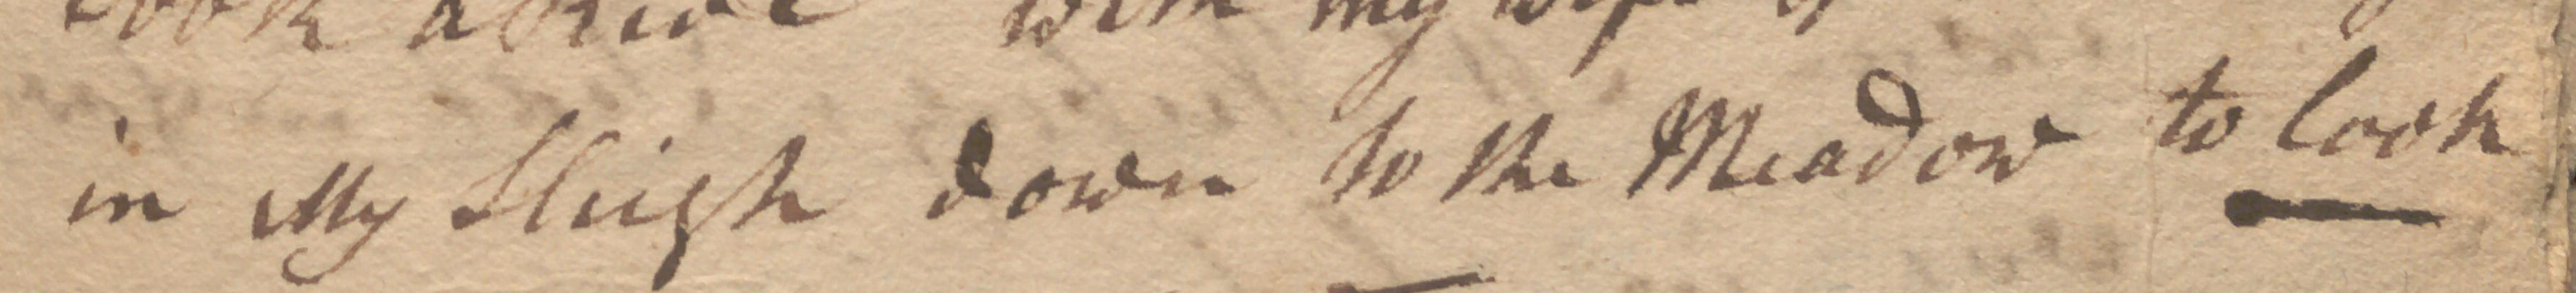in My Sleigh down to the Meadow to look
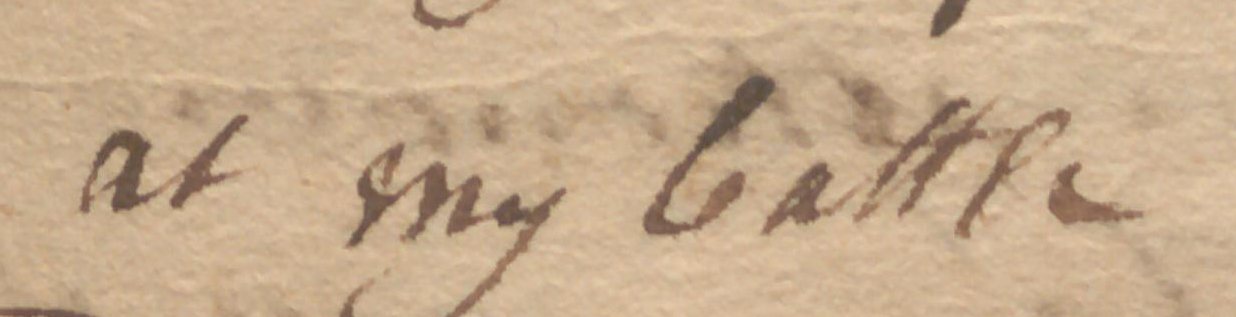at my Cattle
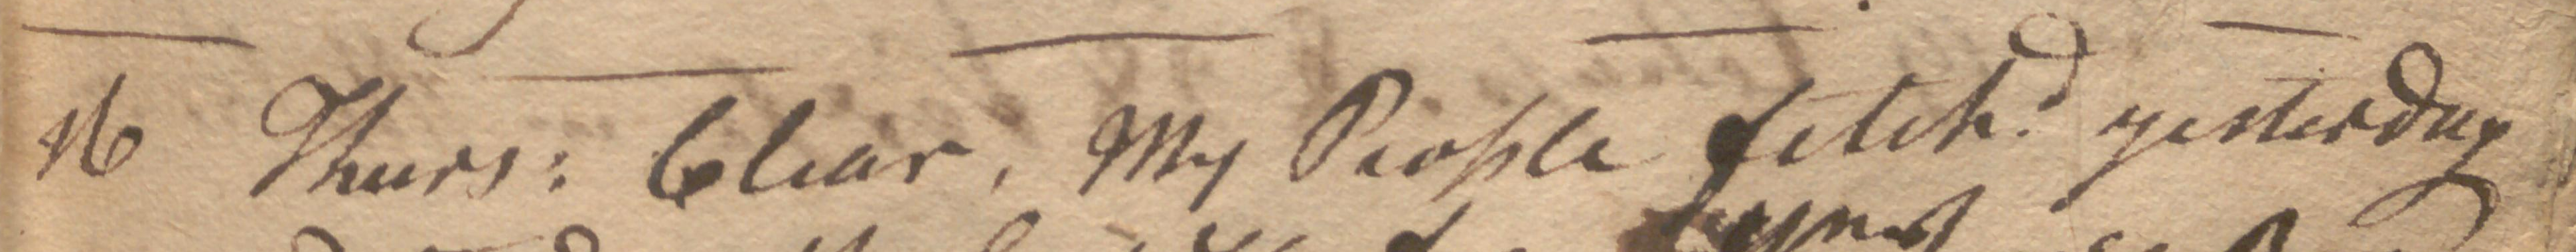16 Thurs. Clear, My People fetch^d. yesterday
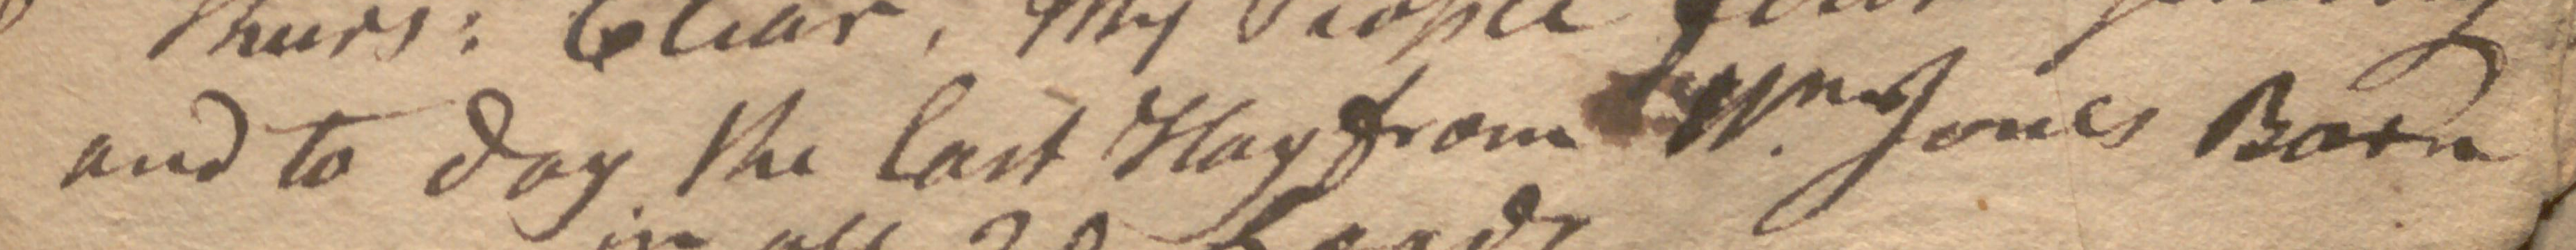and to day the last Hay from W^m. Jones Barn
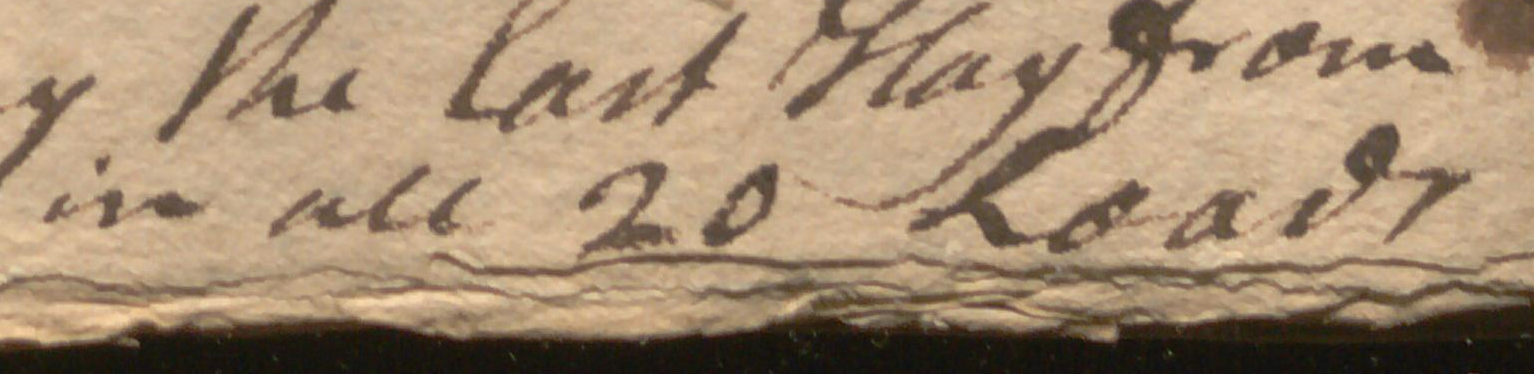in all 20 Loads
